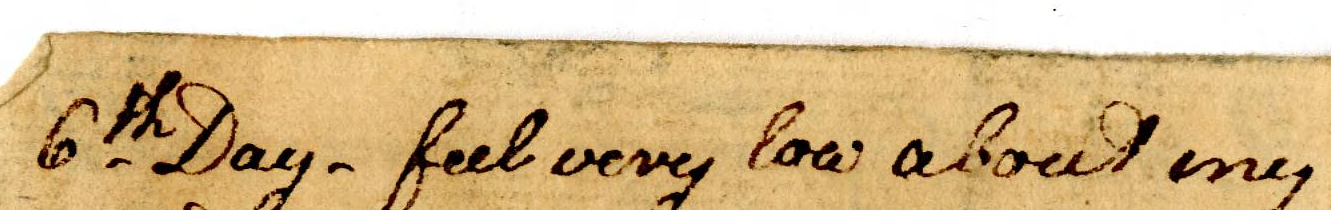6^th Day- feel very low about my
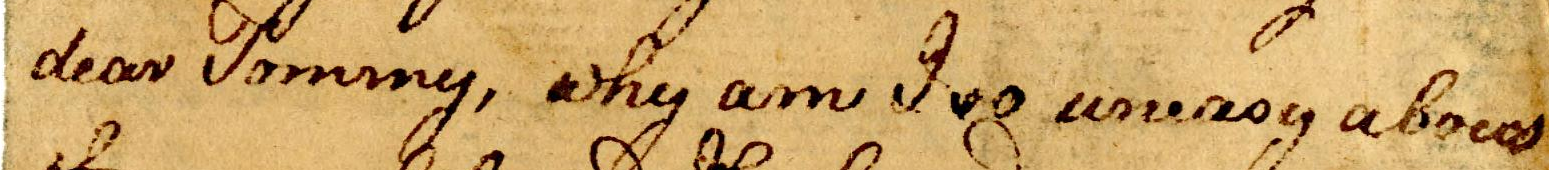dear Tommy, why am I so uneasy about
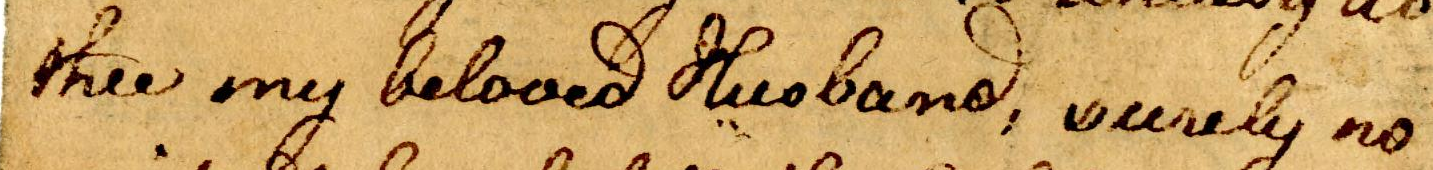thee my beloved Husband, surely no
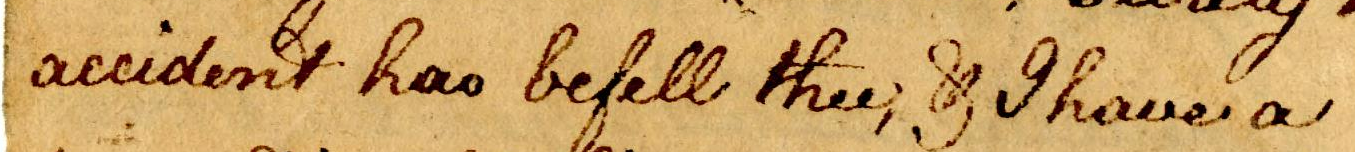accident has befell thee, & I have a
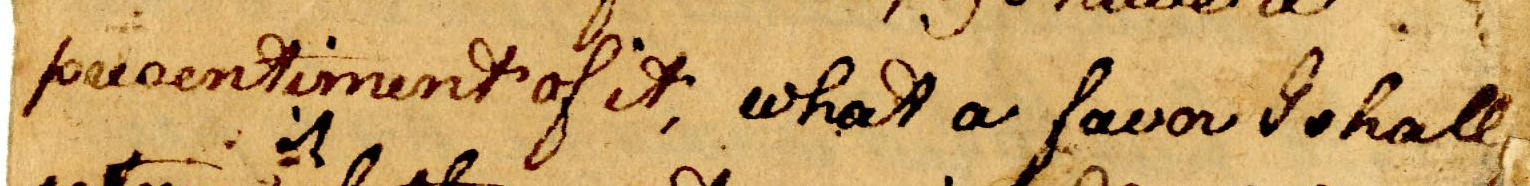presentiment of it, what a favor I shall
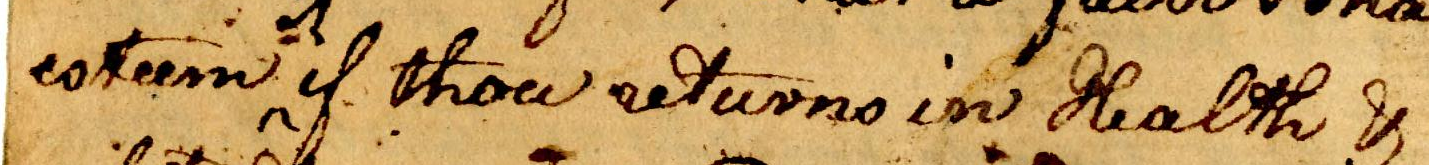esteem ^it if thou returns in Health &
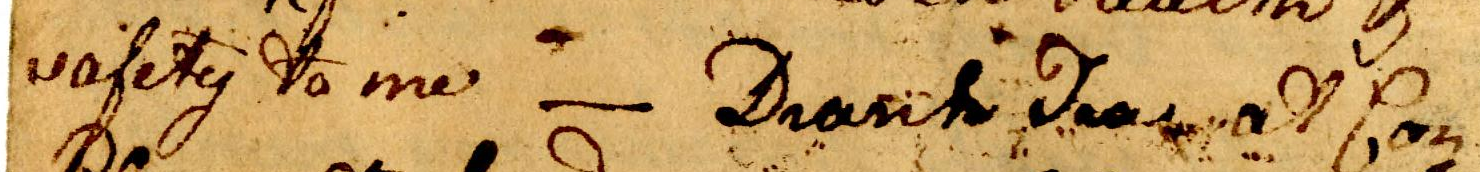safety to me- Drank Tea, at Coz
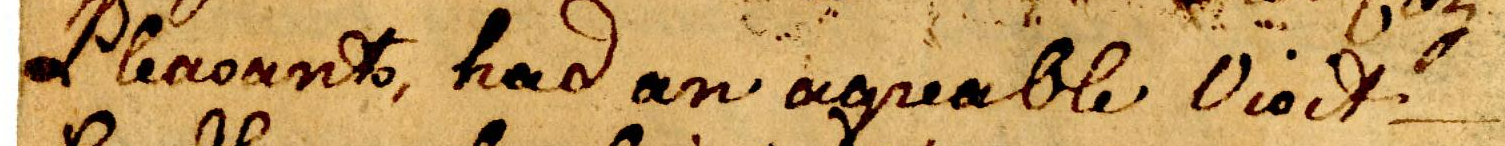Pleasants, had an agreable Visit-
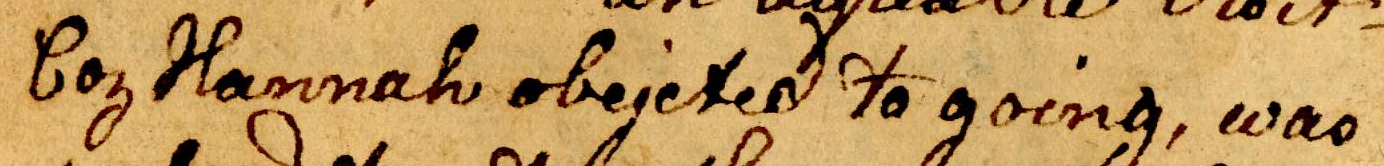Coz Hannah obejcted to going, was
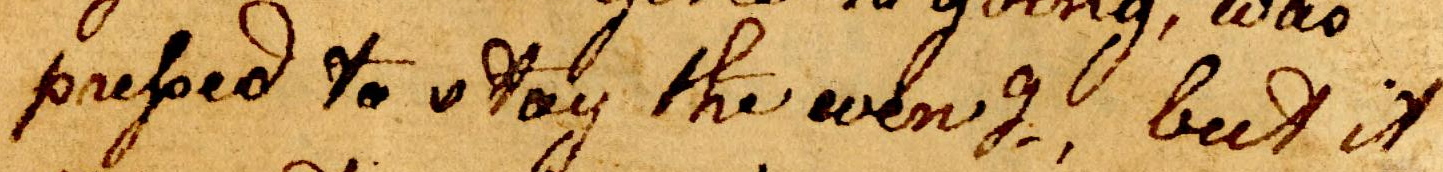pressed to stay the even^g, but it
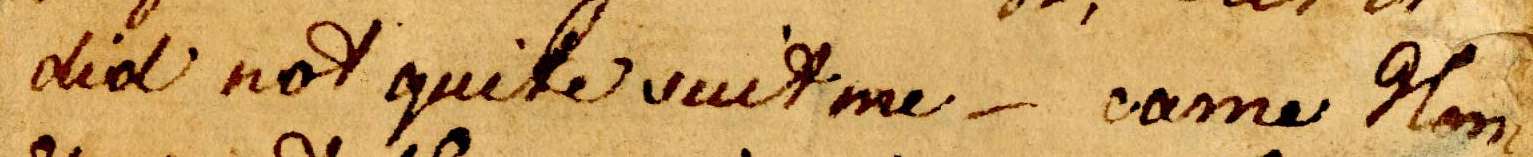did not quite suit me- came Hom
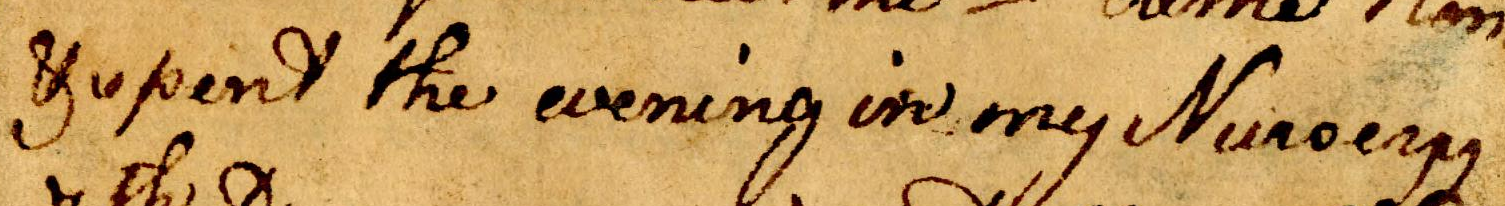& spent the evening in my Nurseryy
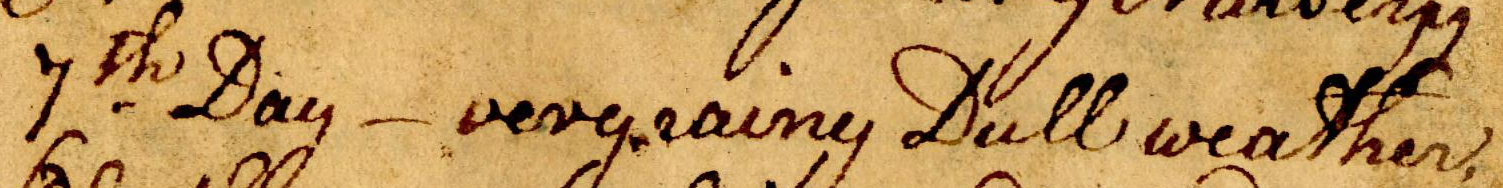7^th Day- very rainy Dull weather,
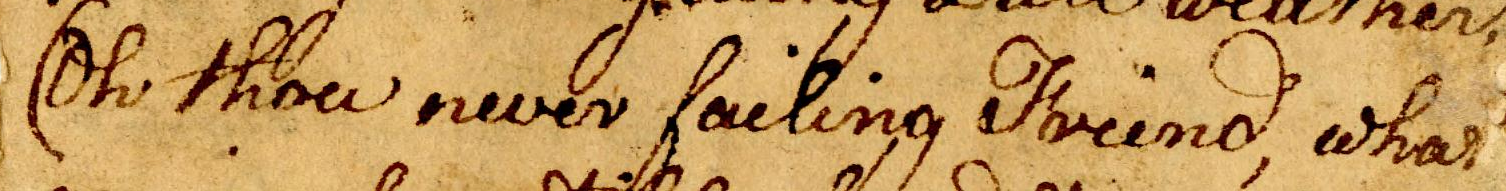(Oh thou never failing Friend, what
